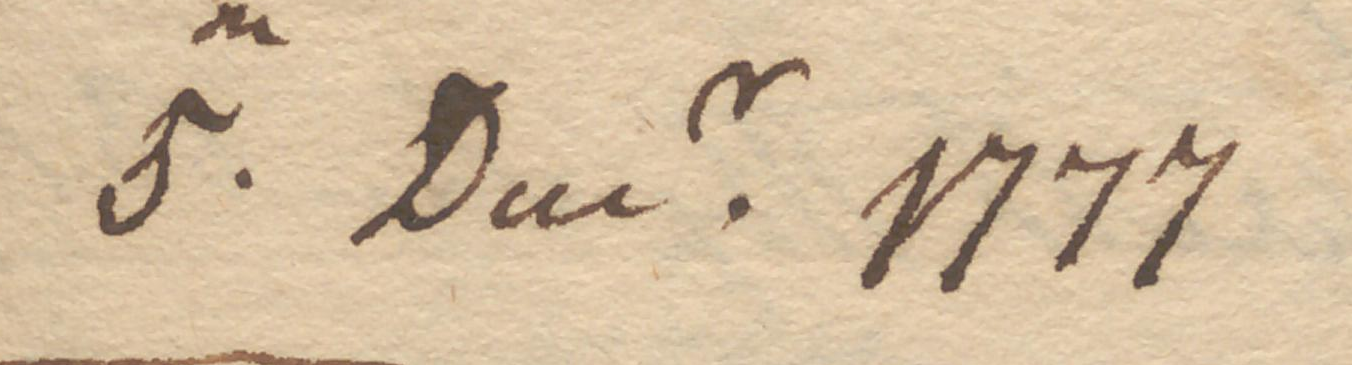5^th. Dece^r. 1777
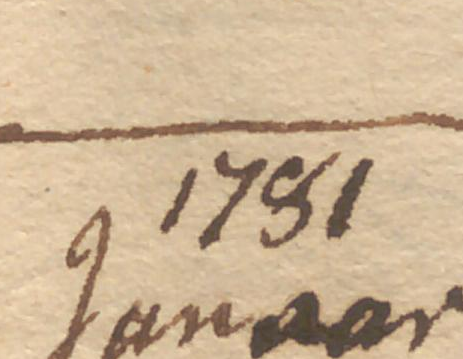1781
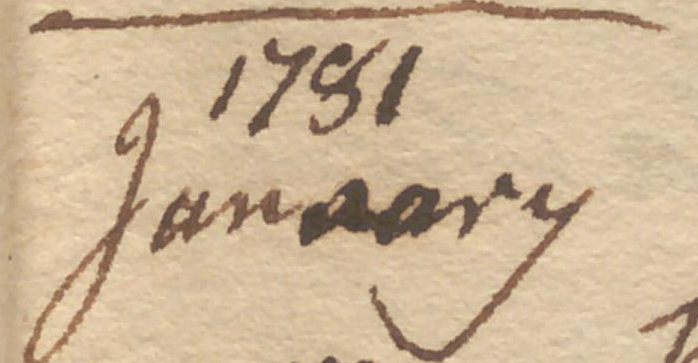January
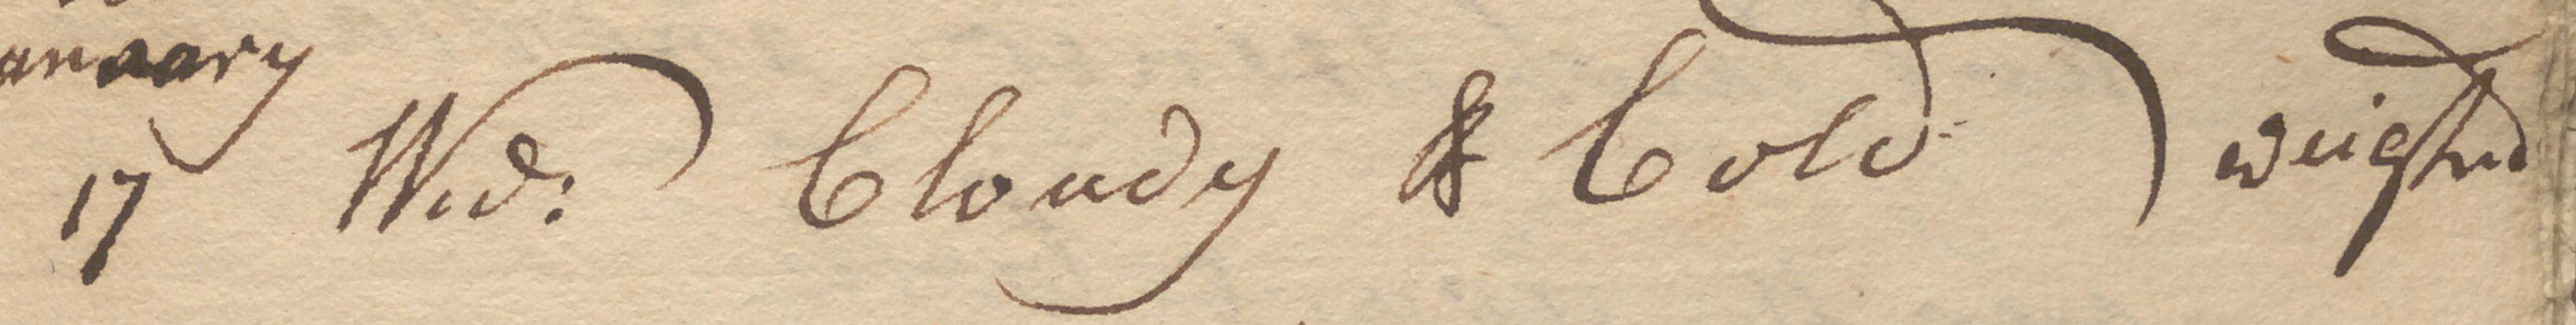17 Wed: Cloudy & Cold. weighed
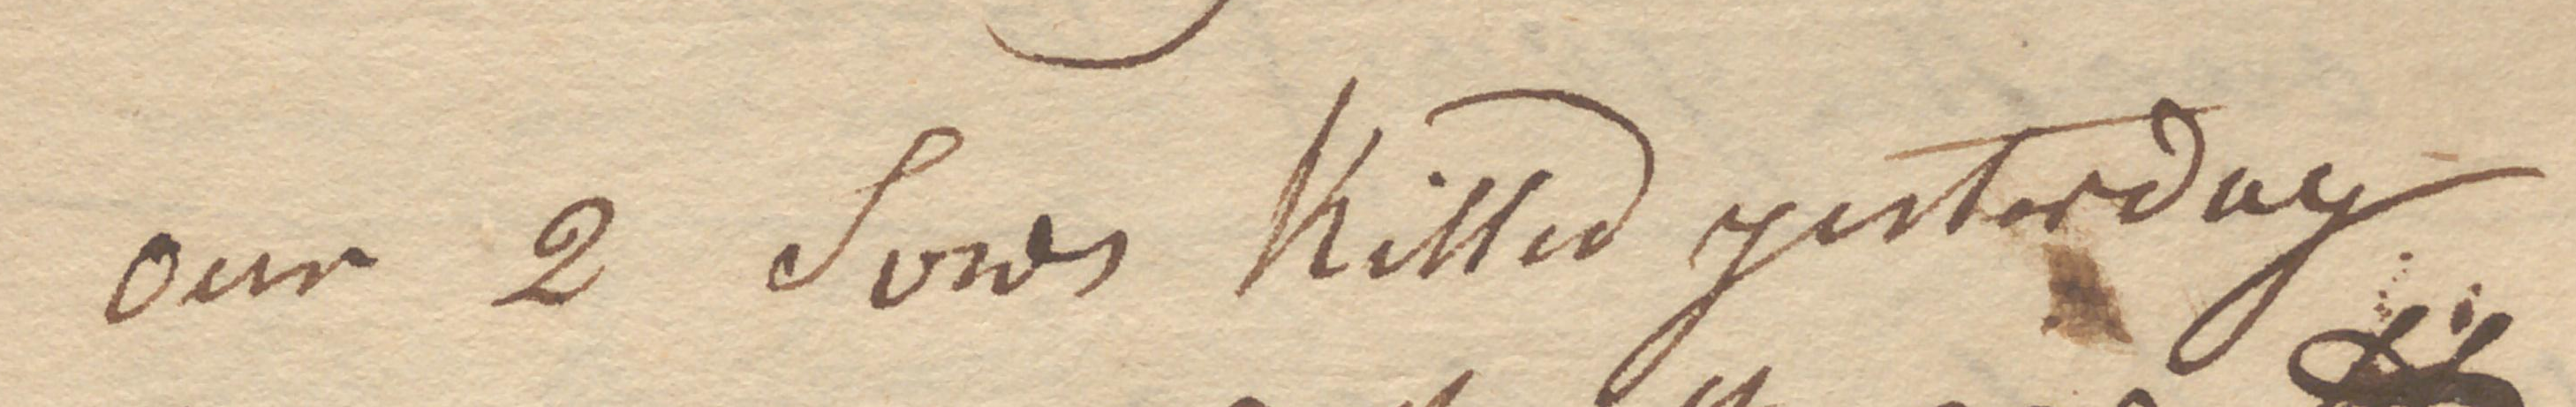our 2 Sows Killed yesterday
